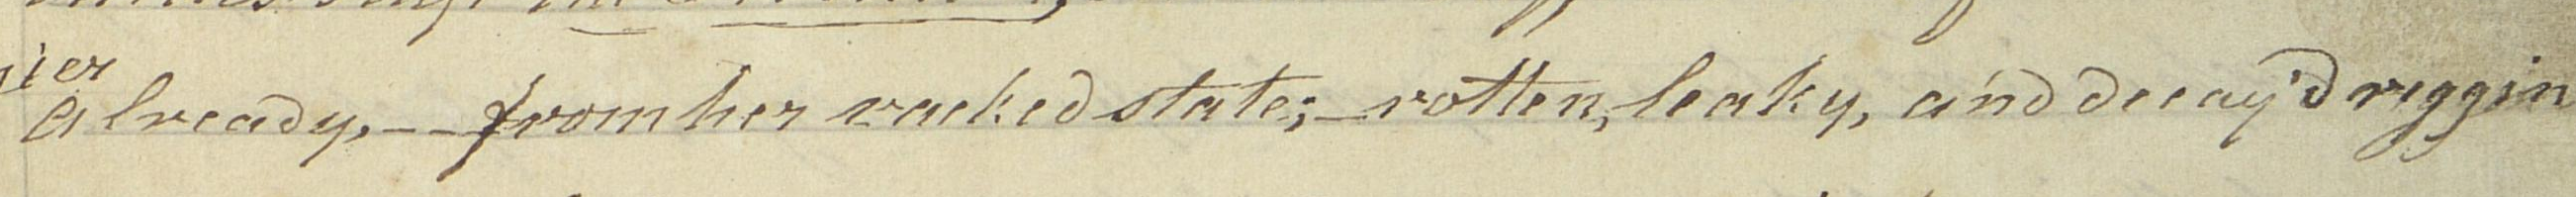already, from her racked state; rotten, leaky and decay'd riggin
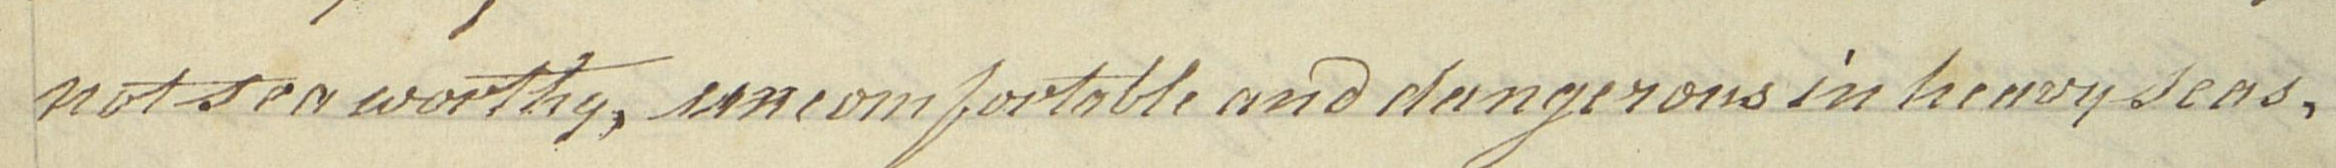not sea worthy, uncomfortable and dangerous in heavy seas,
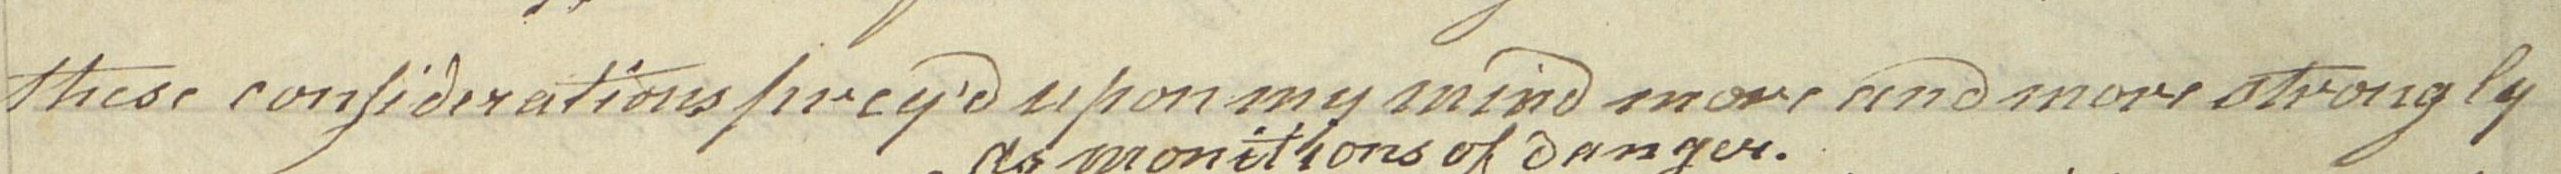these considerations prey'd upon my mind more and more strongly
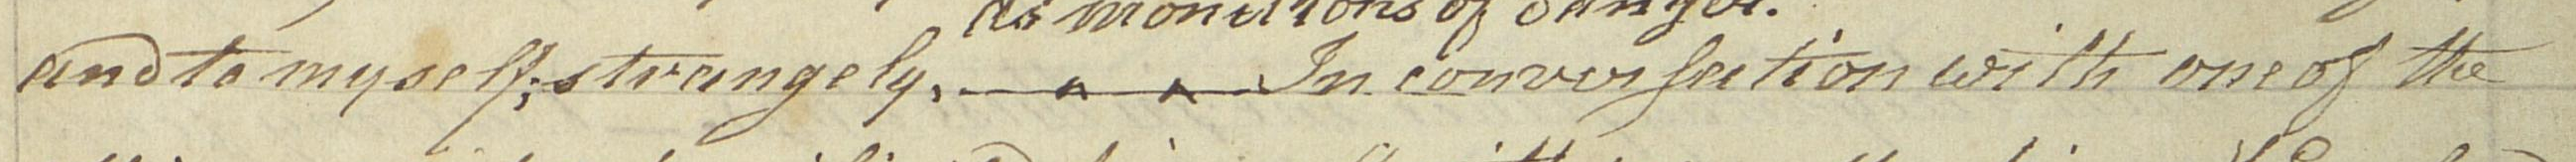and to myself strangely, ^ ^ In conversation with one of the
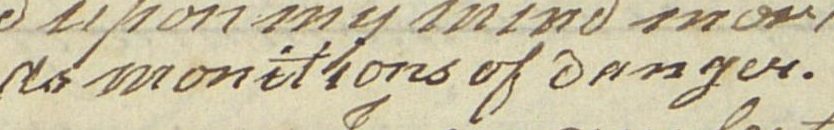as monitions of danger
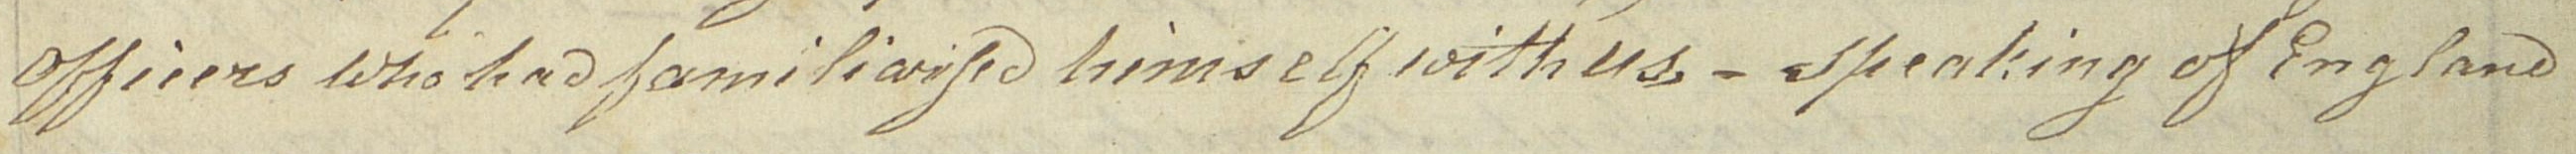Officers who had familiarised himself with us, Speaking of England
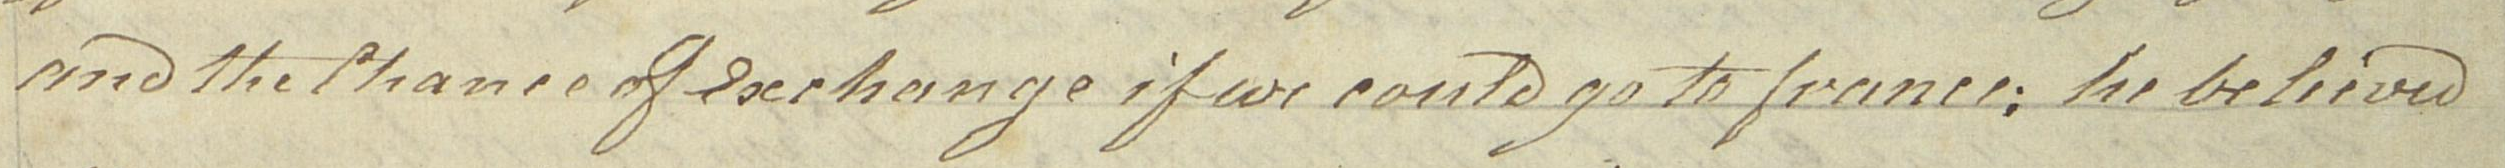and the Chance of Exchange if we could go to france; he believed
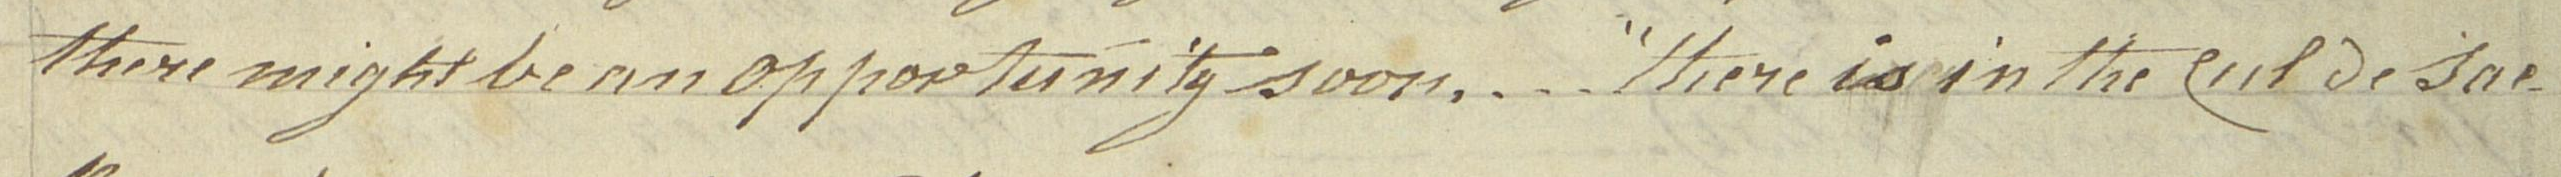there might be an opportunity soon. "there is in the Cul de Sac
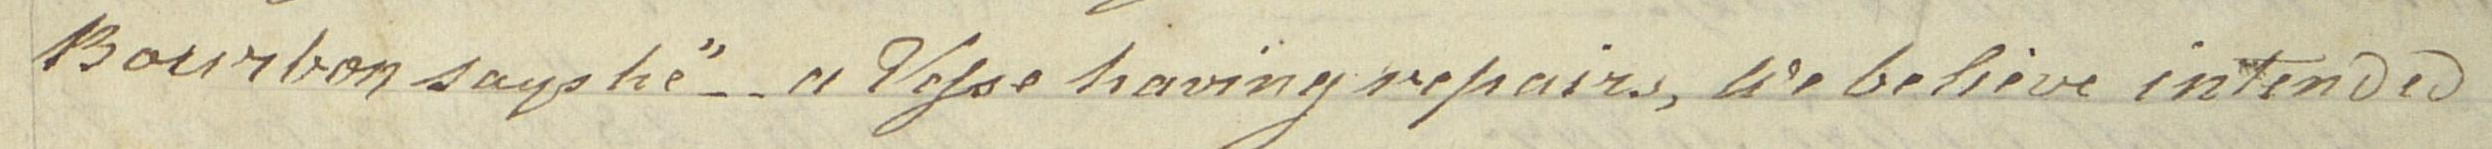Bourbon says he" a Vesse having repairs, We believe intended
